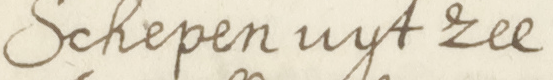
Schepen uijt zee
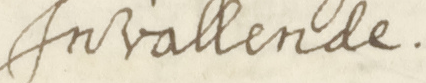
Invallende.
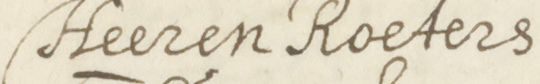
Heeren Roeters
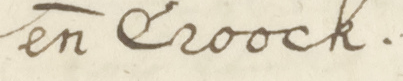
en Croock.
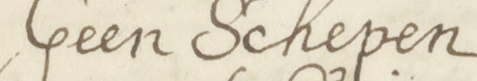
Geen Schepen
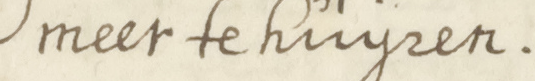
meer te huijren.
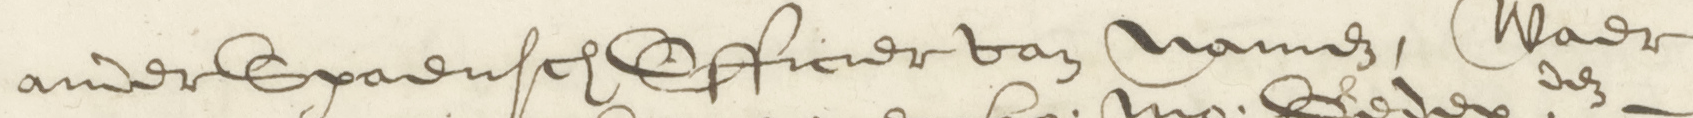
ander Spaensch Officier van namen. Waer
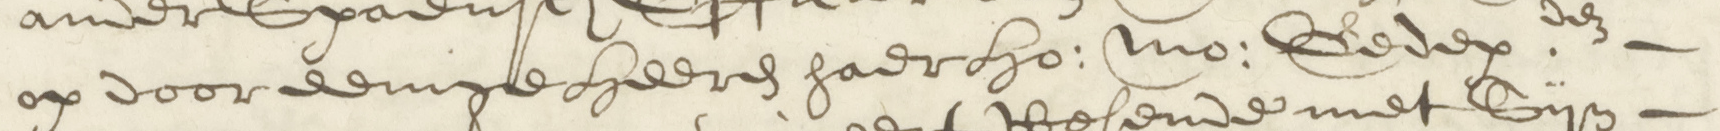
op door eenige heeren haer Ho:Mo: Gedepden —
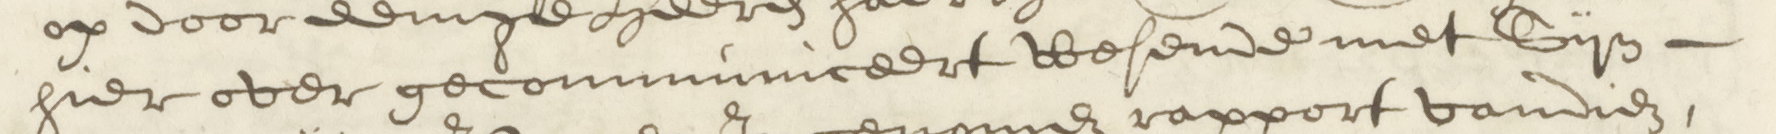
hier over gecommuniceert wesende met Sijn —
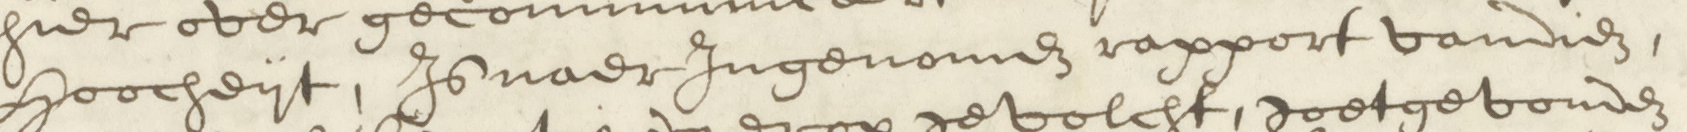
Hoocheijt, Is naer Ingenomen rapport vandien,
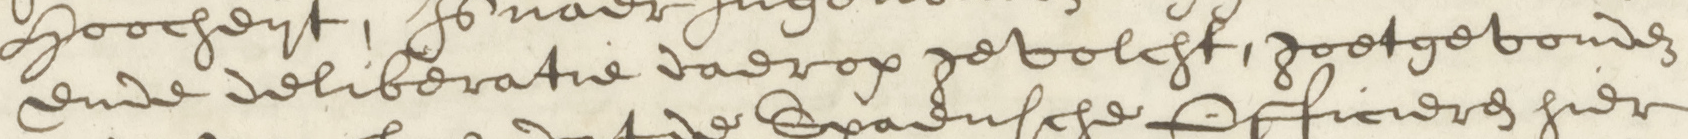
ende deliberatie daerop gevolcht, goetgevonden
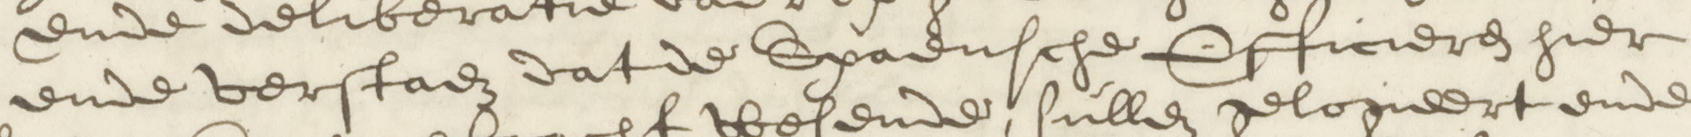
ende verstaen dat de Spaensche Officieren hier
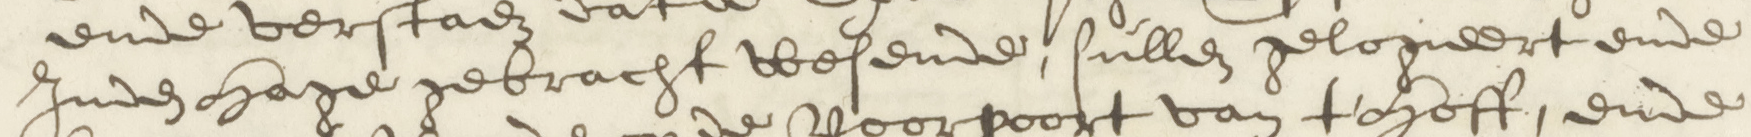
Inden Hage gebracht wesende, sullen gelogueert ende
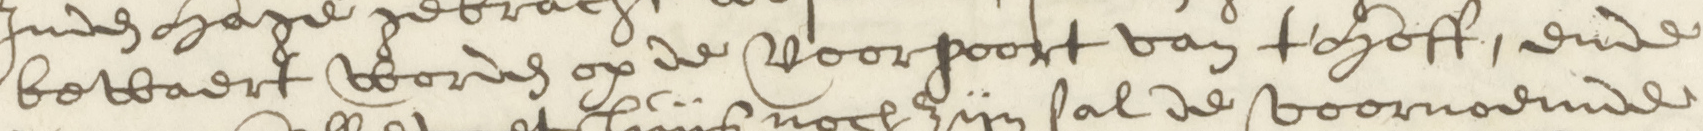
bewaert worden op de Voorpoort van t'Hoff, ende
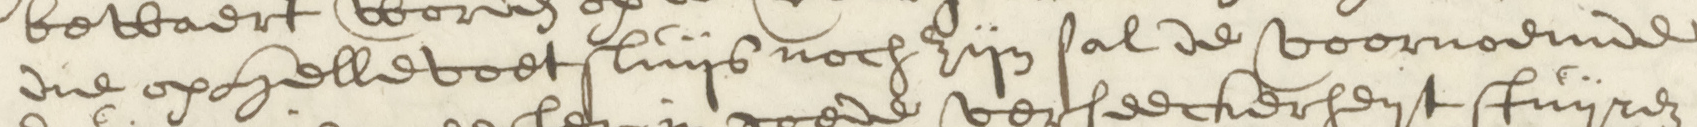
die op Hellevoetsluijs noch zijn sal de voornoemde
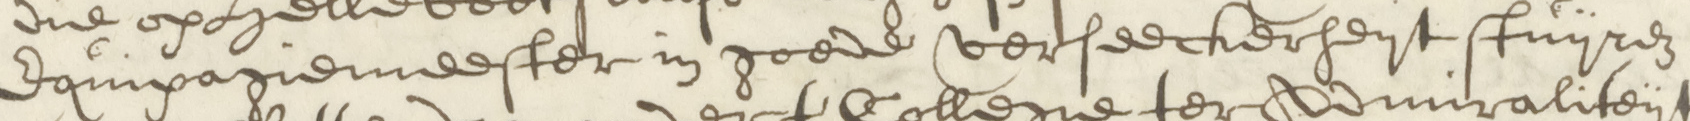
Equipagiemeester in goede verseeckerheijt stuijren
